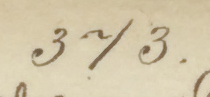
373.
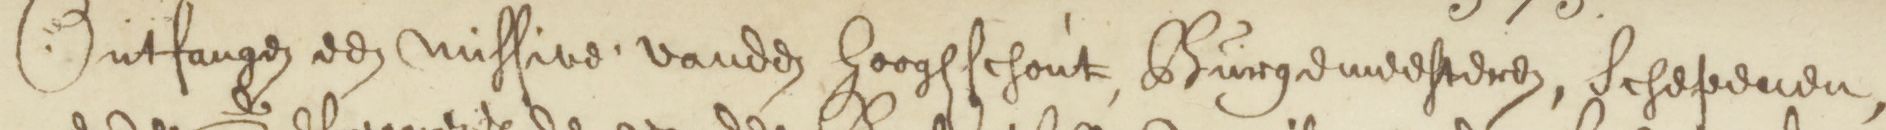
Ontfangen een missive vanden Hooghschout, Burgemeesteren, schepenen,
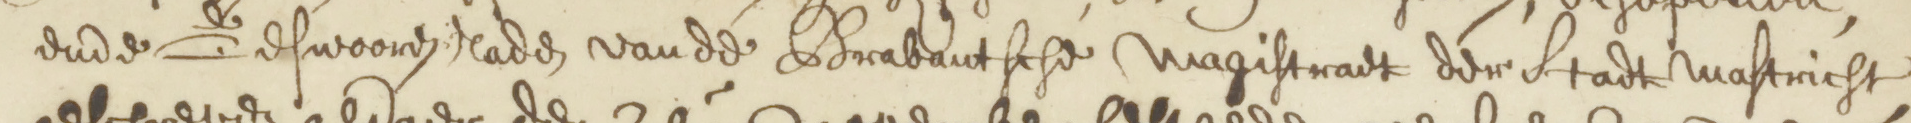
ende Geswooren Raden vande Brabantsche Magistraet der stadt mastricht,
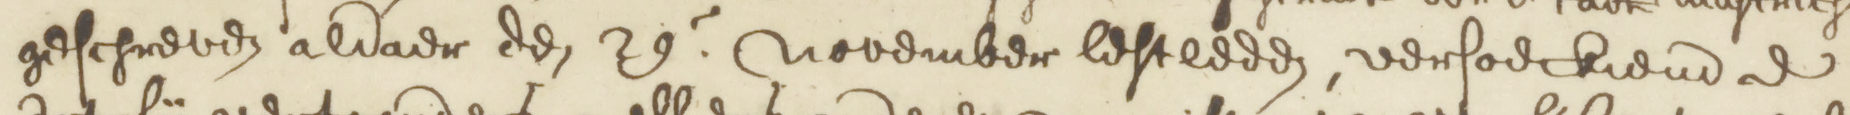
geschreven aldaer den 29e november lestleden, versoeckende
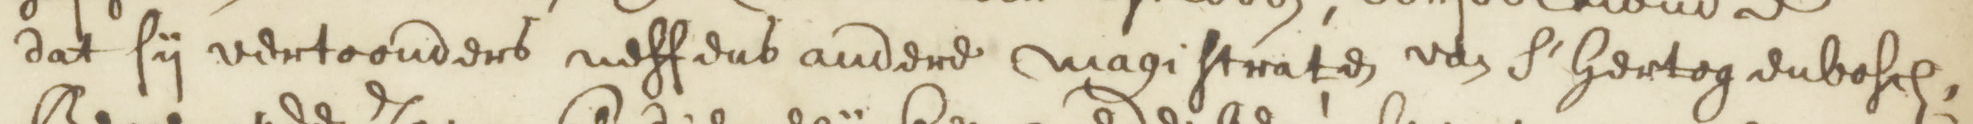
dat sij vertoonders neffens andere magistraten van s‛Hertogenbosch,
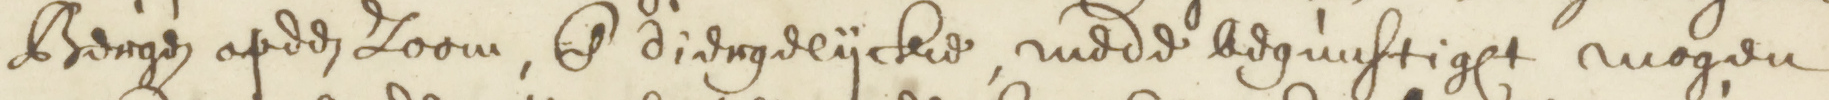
Bergen opden Zoom, & diergelijcke mede begunstight mogen
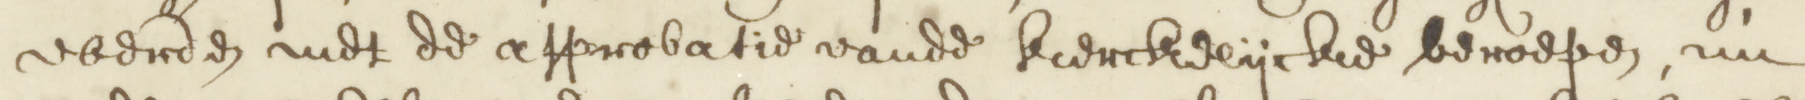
werden met de approbatie vande kerckelijcke beroepen, nu
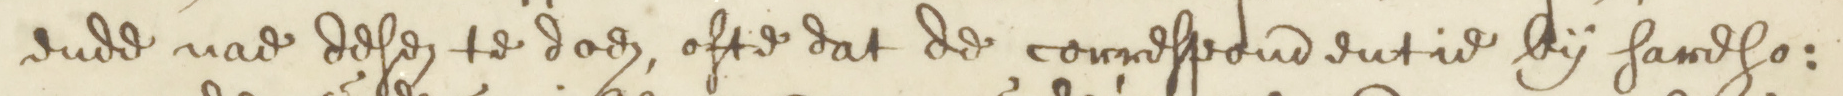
ende nae desen te doen, ofte dat de correspondentie bij hare ho:
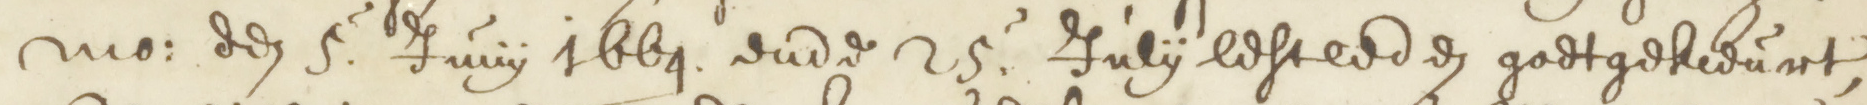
mo: den 5e. Junij 1664. ende 25e. Julij lestleden goetgekeurt,
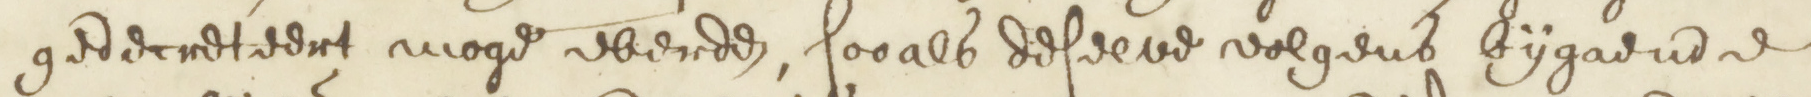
gedecreteert moge werden, soo als deselve volgens bijgaende
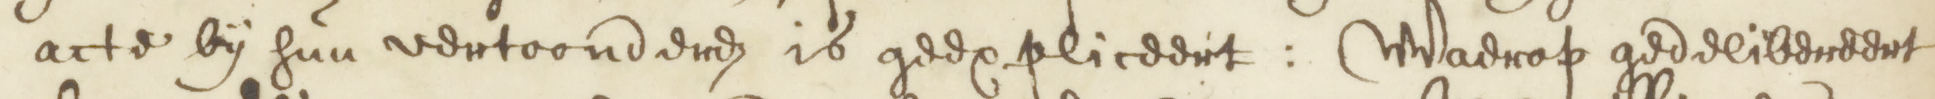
acte bij hun vertoonderen is geexpliceert: Waerop gedelibereert
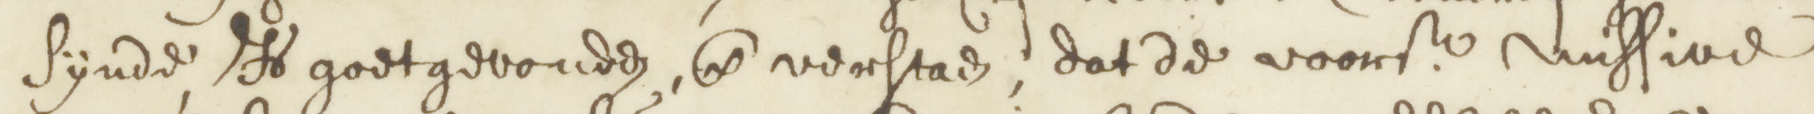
sijnde, Is goetgevonden, & verstaen, dat de voors. missive,
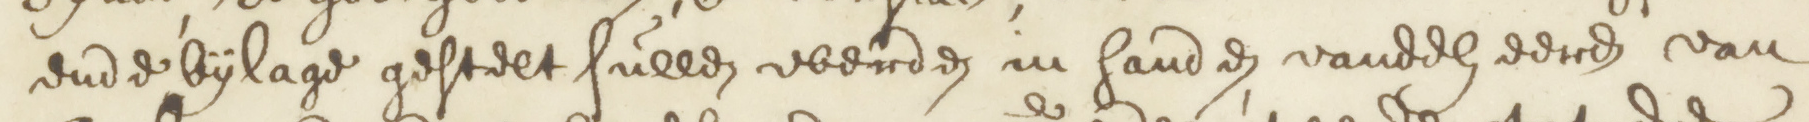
ende bijlage gestelt sullen werden in handen vande heeren van
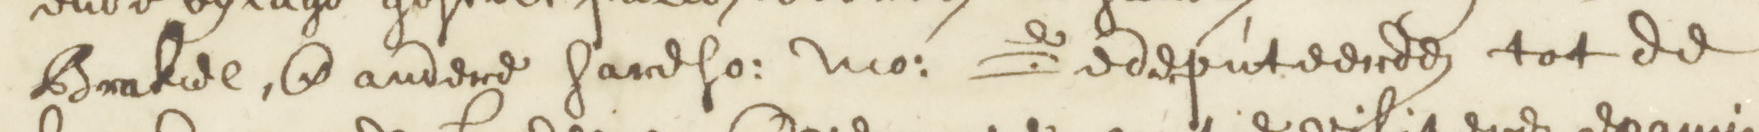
Brakel, & andere hare ho:mo: Gedeputeerden tot de
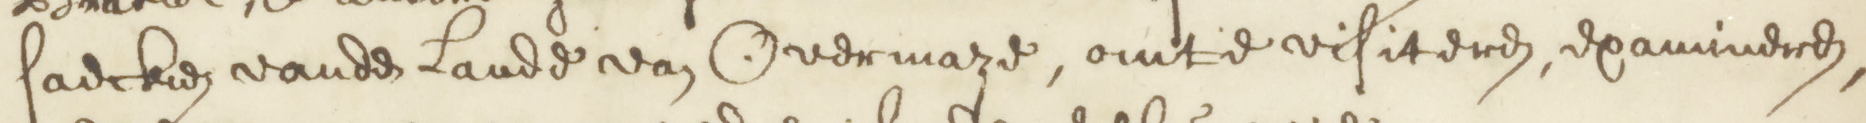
saecken vanden Lande van Overmaze, om te visiteren, examineren,
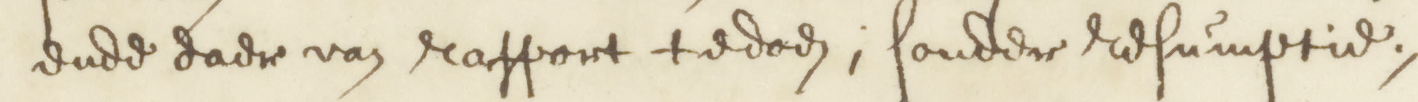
ende daer van rapport te doen, sonder resumptie.
